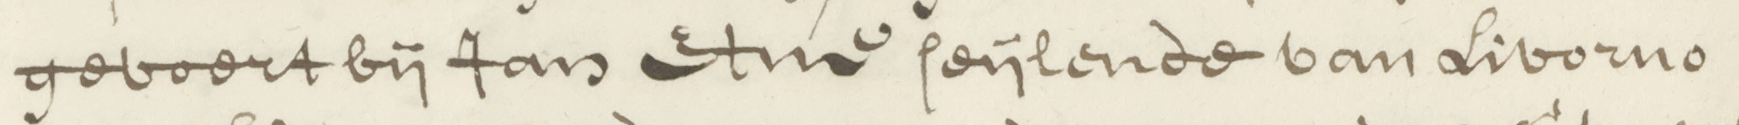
gevoert bij Jan Etne seijlende van Livorno
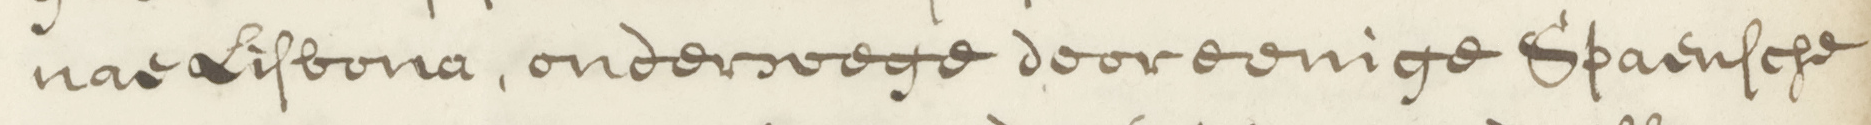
nae Lisbona, onderwege door eenige Spaensche
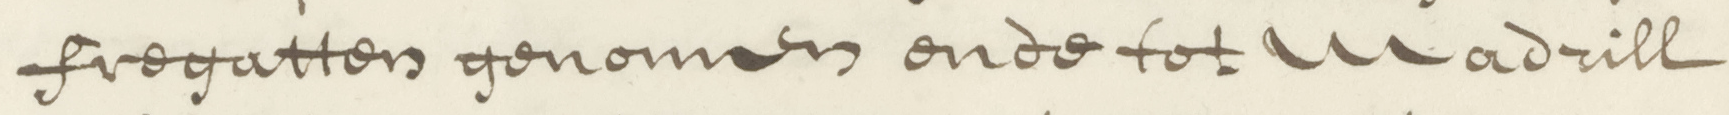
fregatten genomen ende tot Madrill
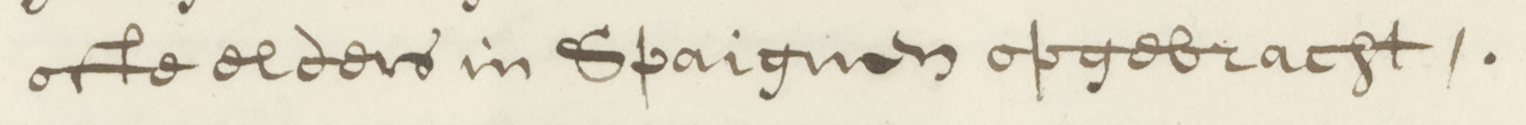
ofte elders in Spaignen opgebracht.
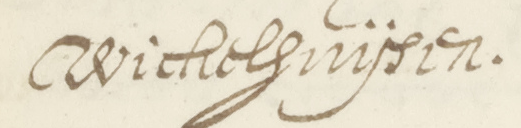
Wichelhuijsen
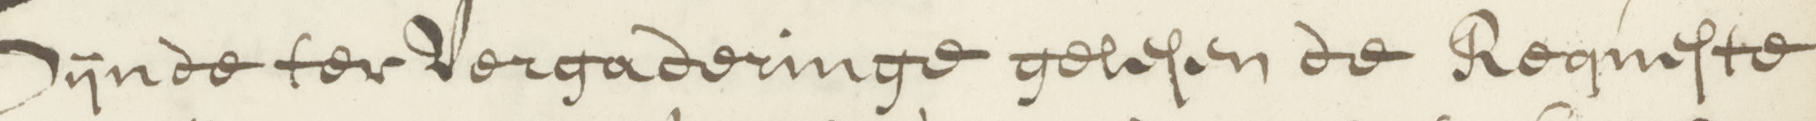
Sijnde ter Vergaderinge gelesen de Requeste
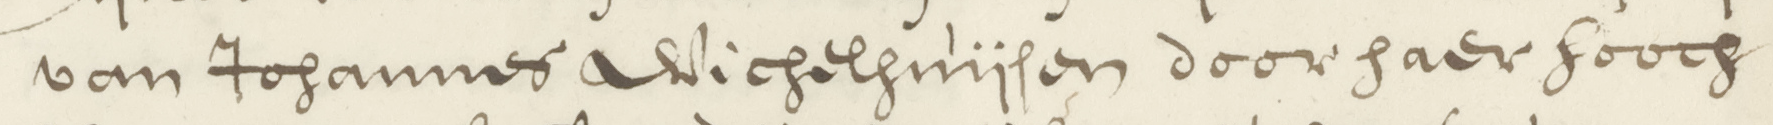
van Johannes Wichelhuijsen door haer hooch
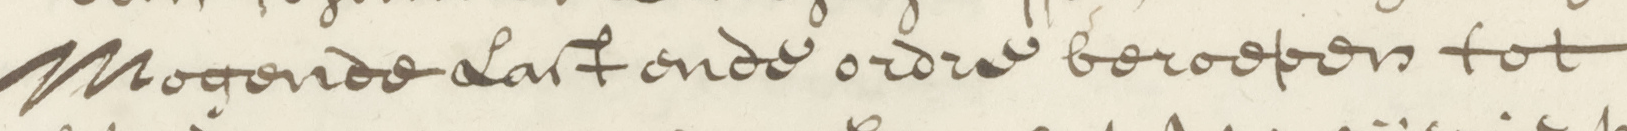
Mogende Last ende ordre beroepen tot
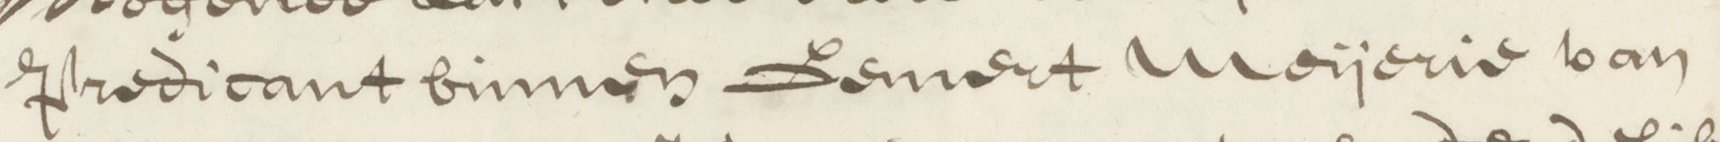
Predicant binnen Gemert Meijerie van
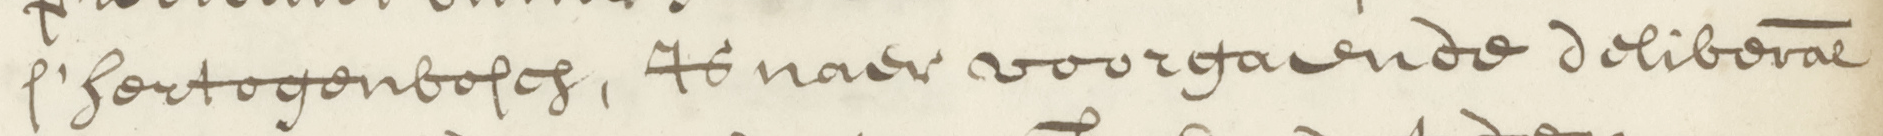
s‛hertogenbosch, Is naer voorgaende deliberae
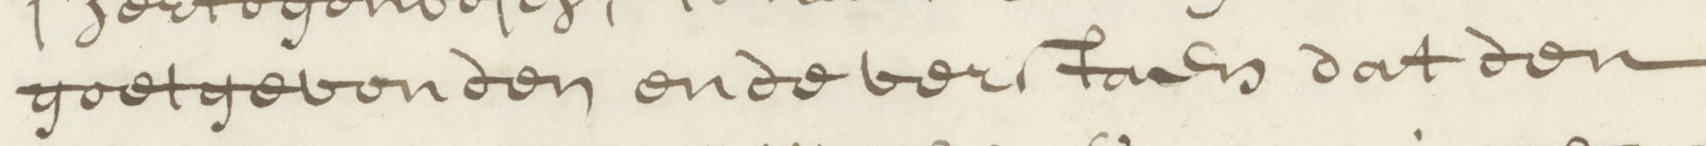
goetgevonden ende verstaen dat den
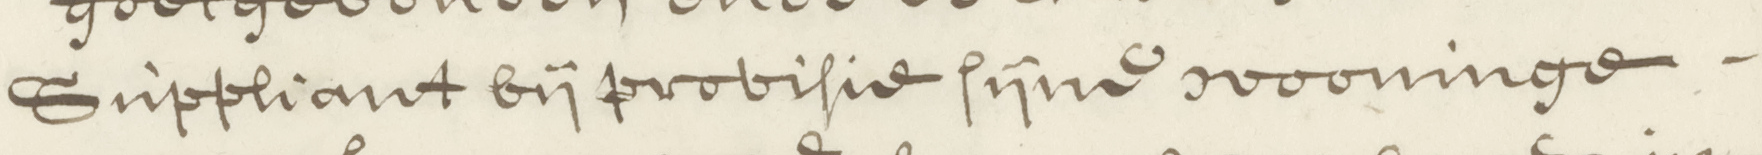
Suppliant bij provisie sijne wooninge
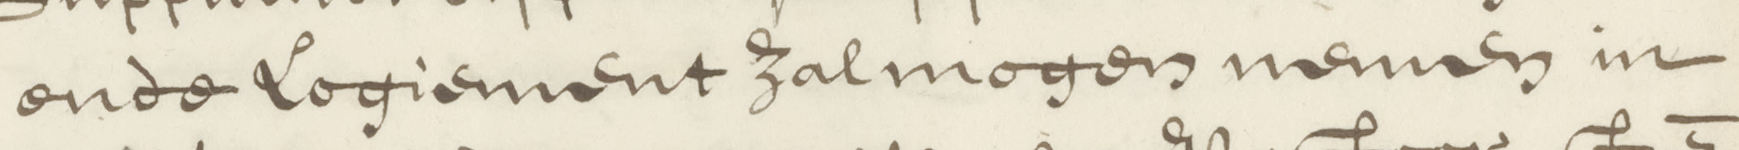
ende Logiement zal mogen nemen in
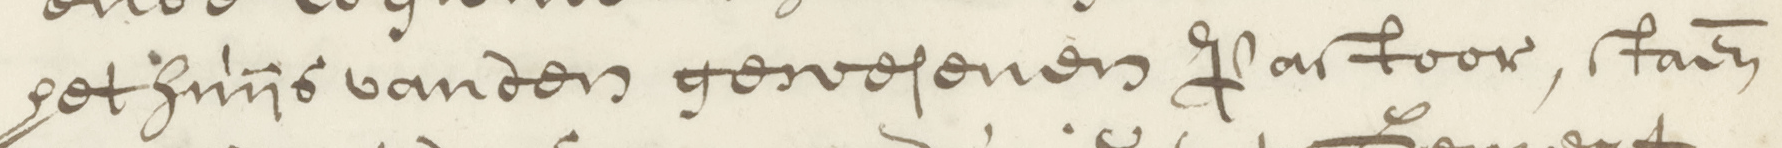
het huijs vanden gewesenen Pastoor, staen
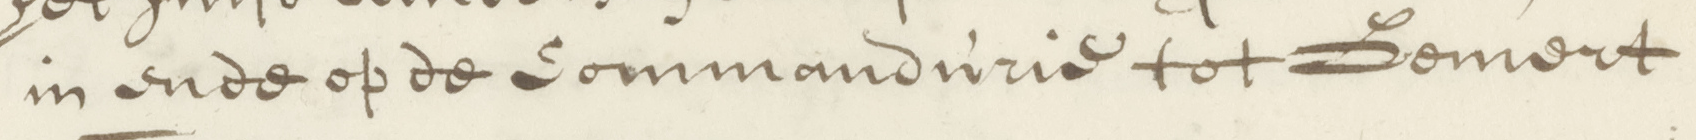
in ende op de Commandurie tot Gemert
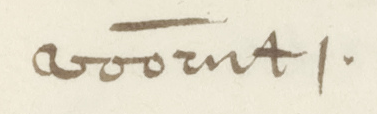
voornt.
